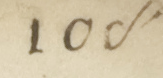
108
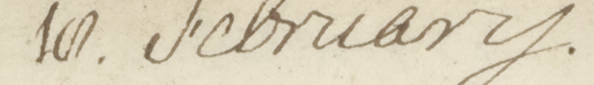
18. February.
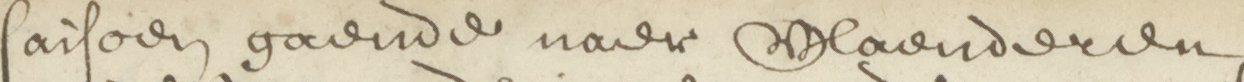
saisoen gaende naer Vlaenderen
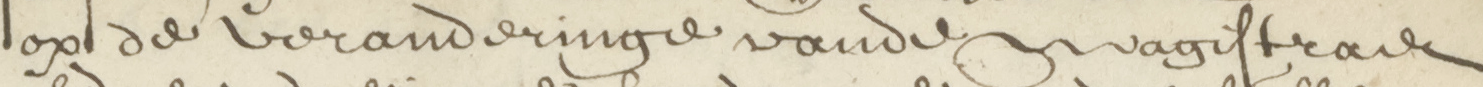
op de veranderinge vande Magistraet
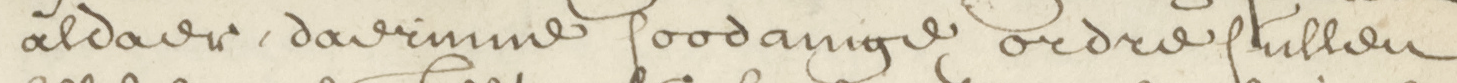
aldaer, daerinne soodanige ordre sullen
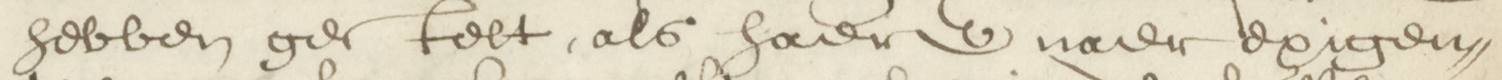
hebben gestelt, als haer E naer exigen„
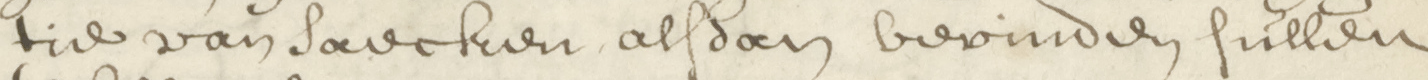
tie van Saecken alsdan bevinden sullen
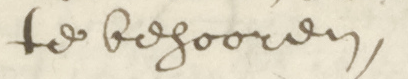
te behooren.
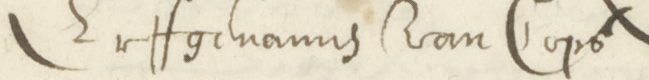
Erffgenamen van Cops
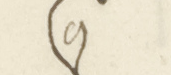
ca
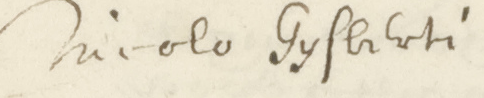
Nicolo Gysberti
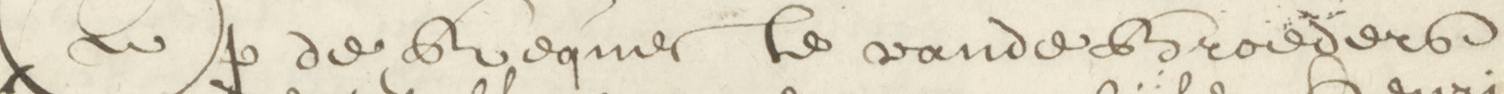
Op de Requeste vande Broeders
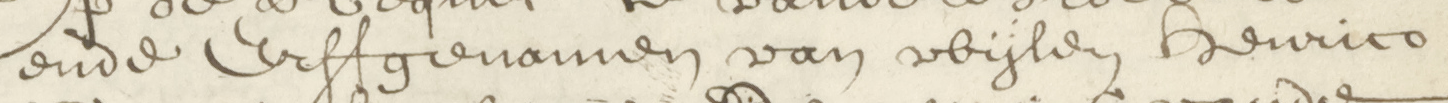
ende Erffgenamen van wijlen Henrico
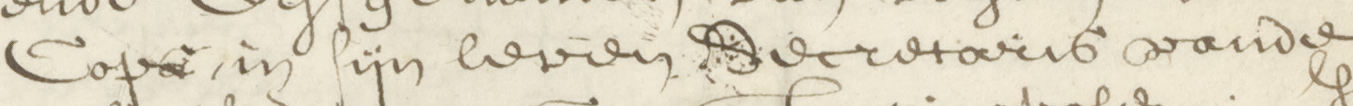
Cops, in sijn leven Secretaris vande
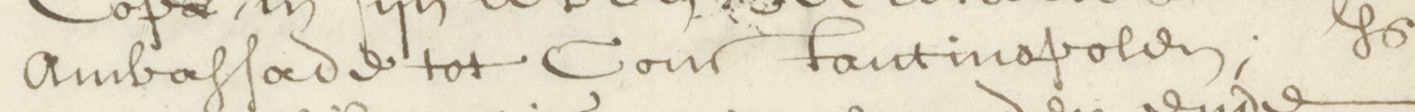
Ambassade tot Constantinopolen; Is
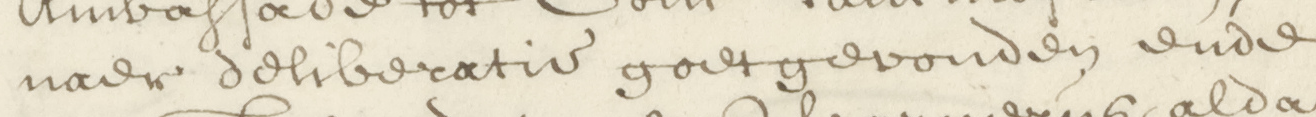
naer deliberatie goetgevonden ende
